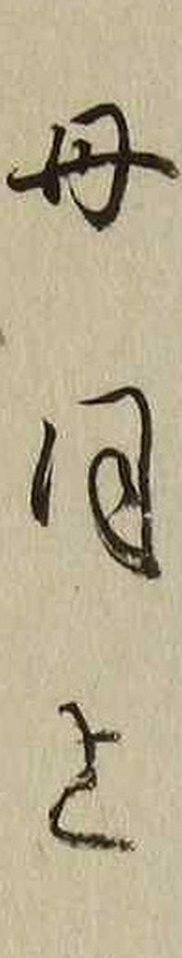母同上
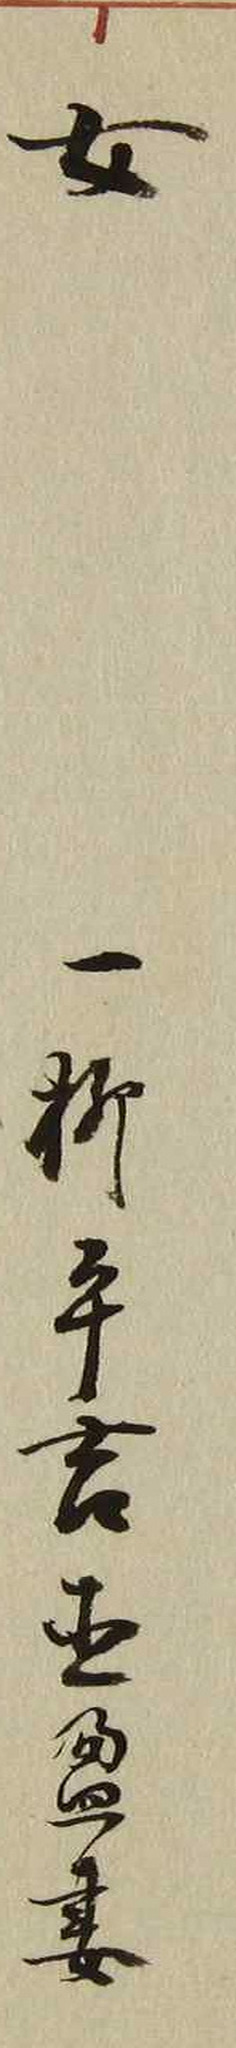女一柳平吉直盈妻
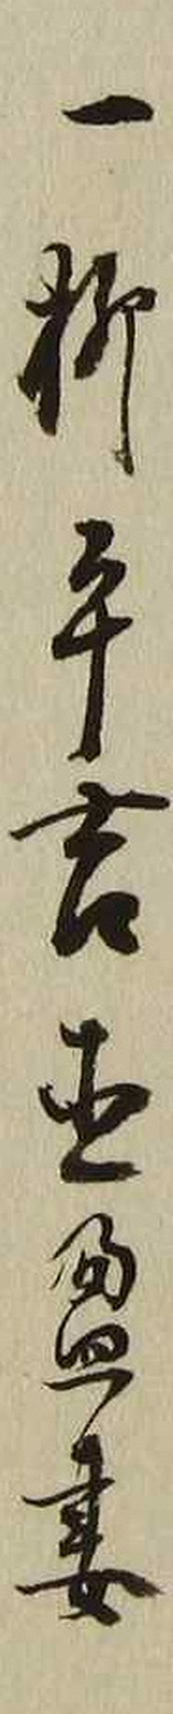女一柳平吉直盈妻
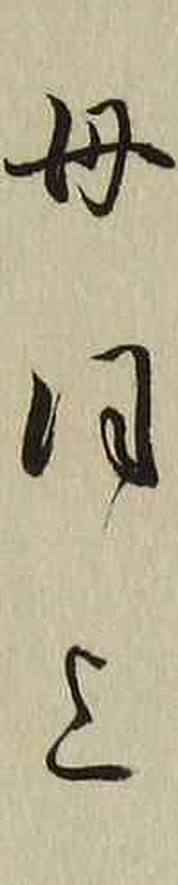母同上
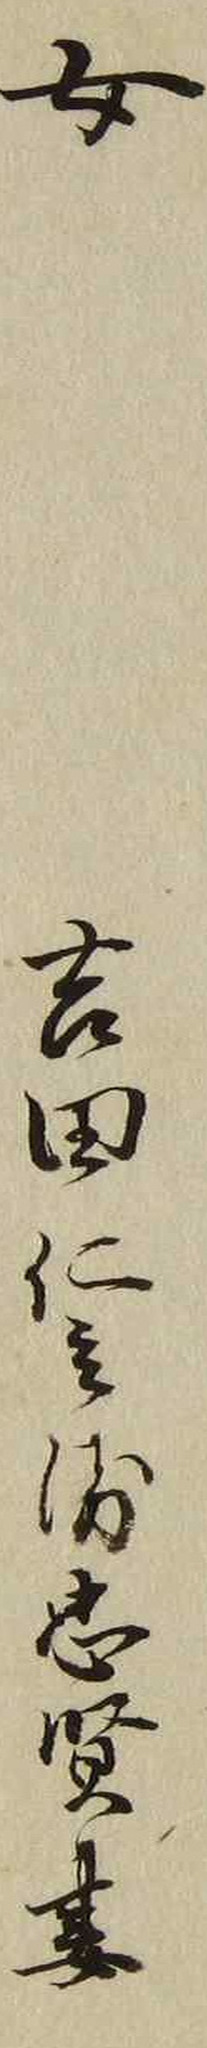女吉田仁兵衛忠賢妻
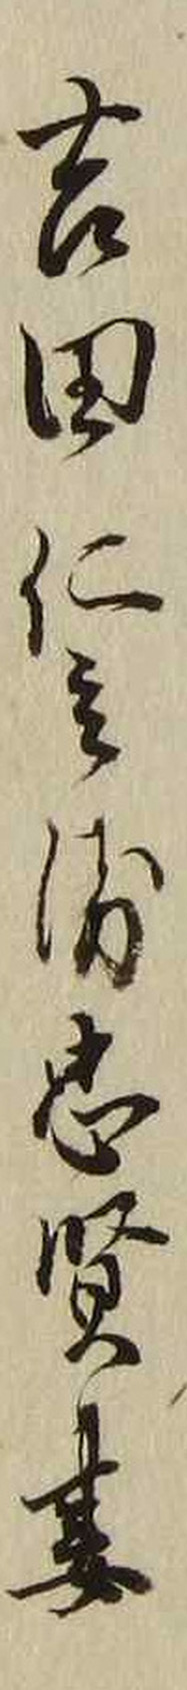女吉田仁兵衛忠賢妻
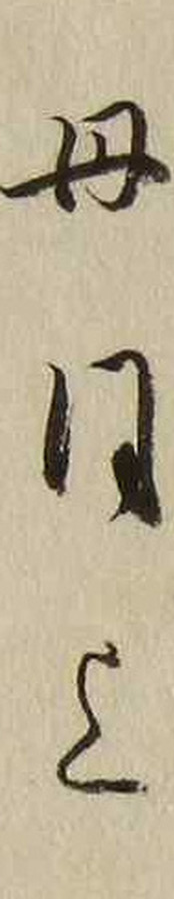母同上

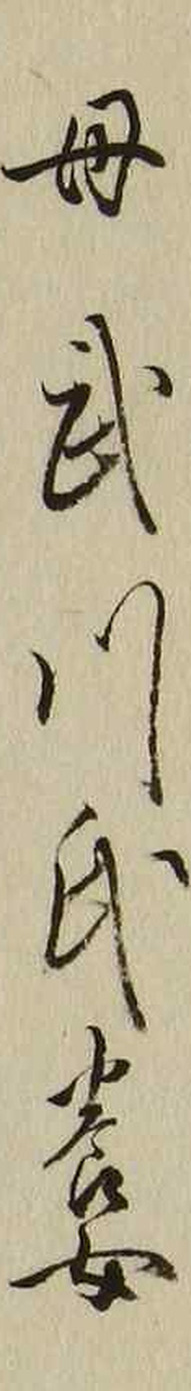母武川氏養女
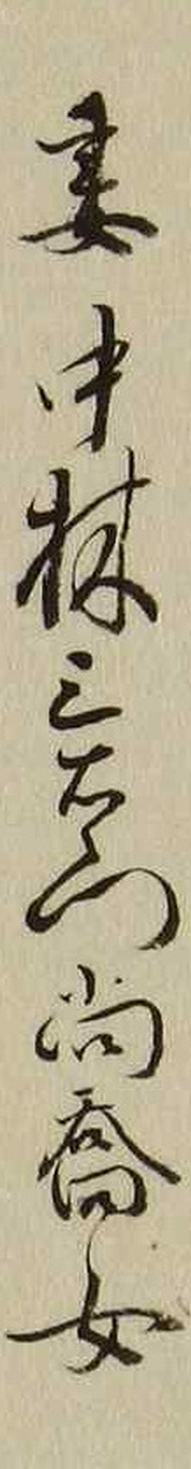妻中林三右門尚喬女
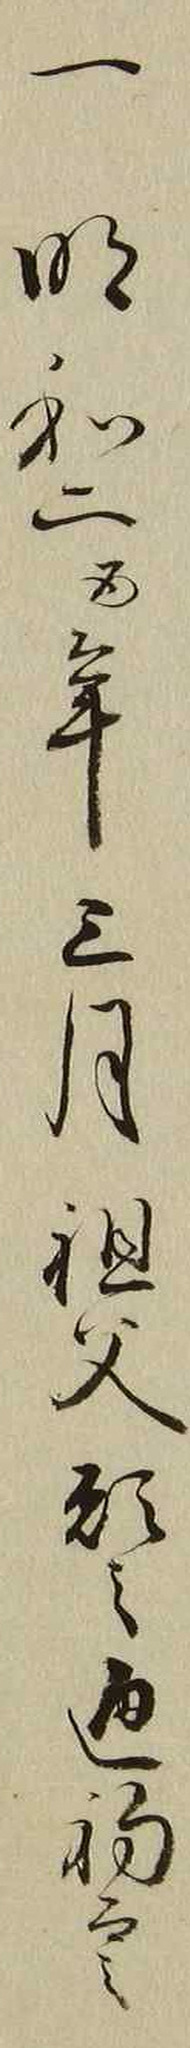一明和二酉年三月祖父願之通初而之
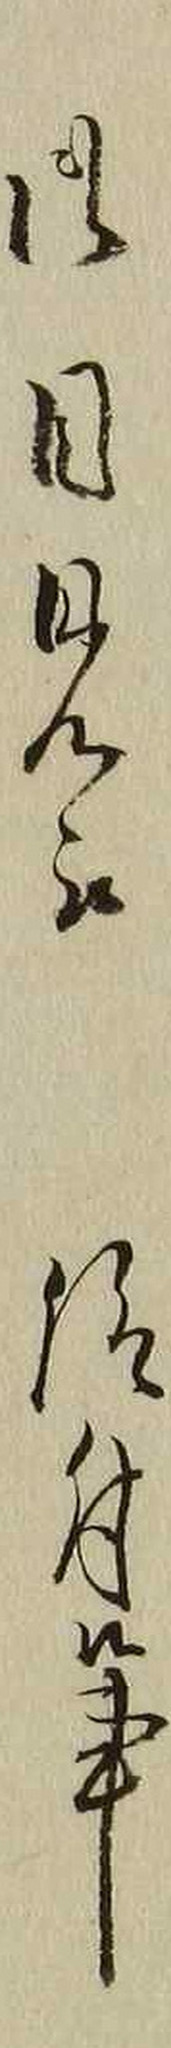御目見被仰付候事
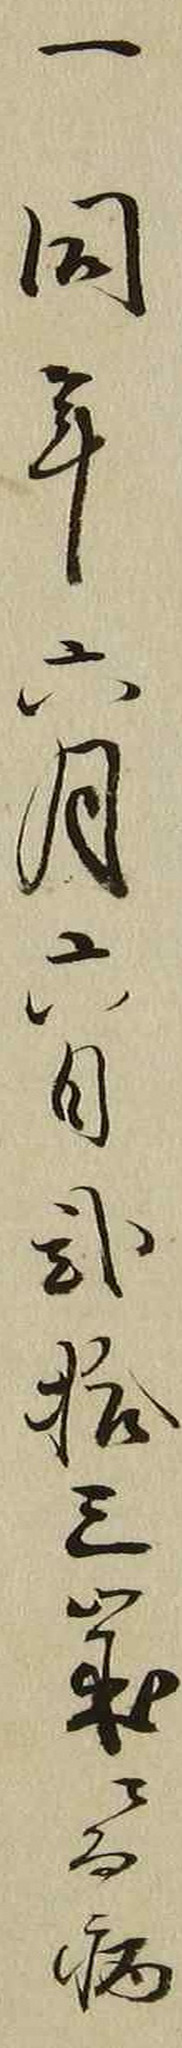一同年六月六日弐拾三歳ニ而病
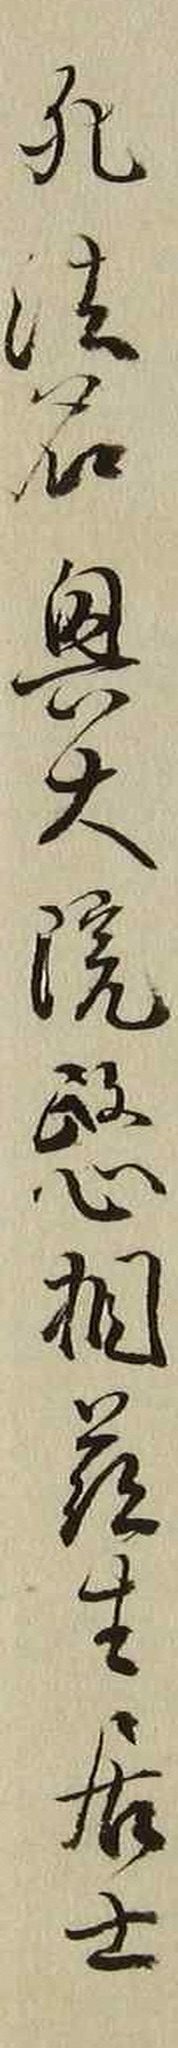死法名興大院愍相茲生居士
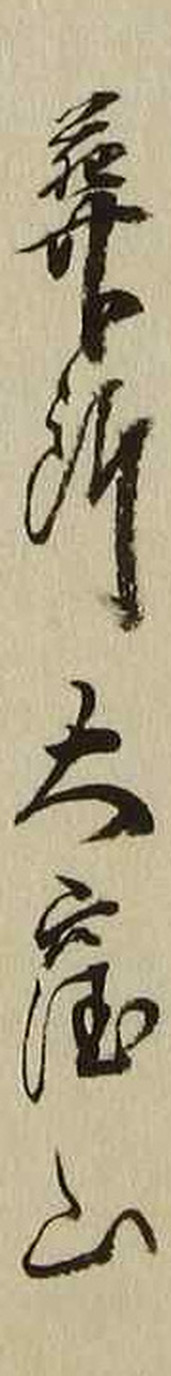葬所大窪山
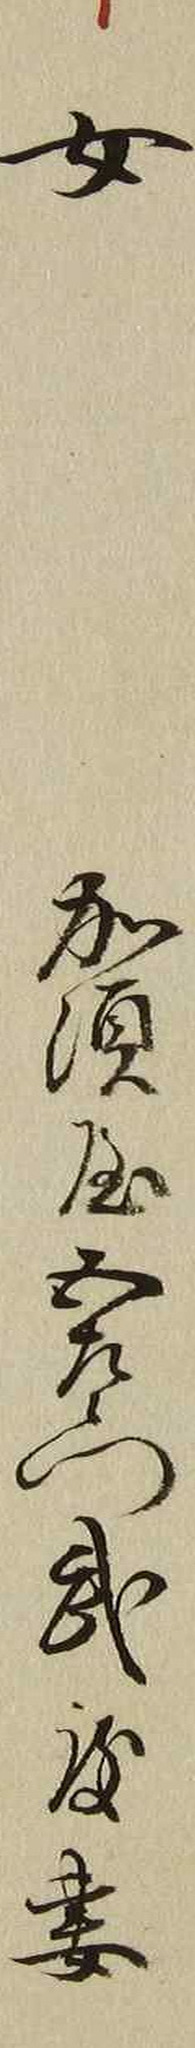女加須屋五左門武度妻
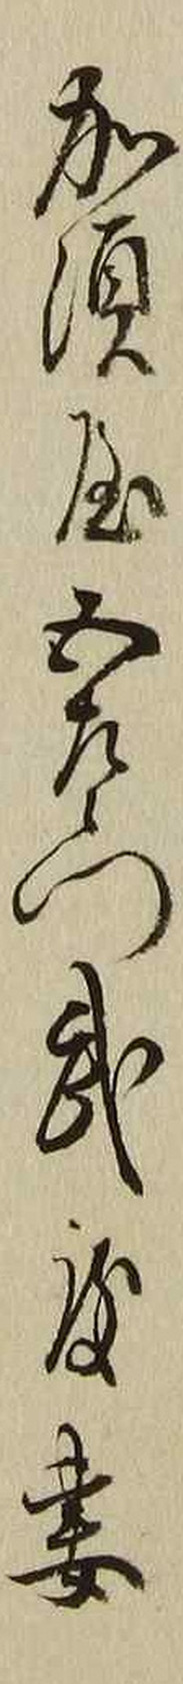女加須屋五左門武度妻
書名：諸士系譜　巻之1　い之部1
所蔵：会津若松市立会津図書館
